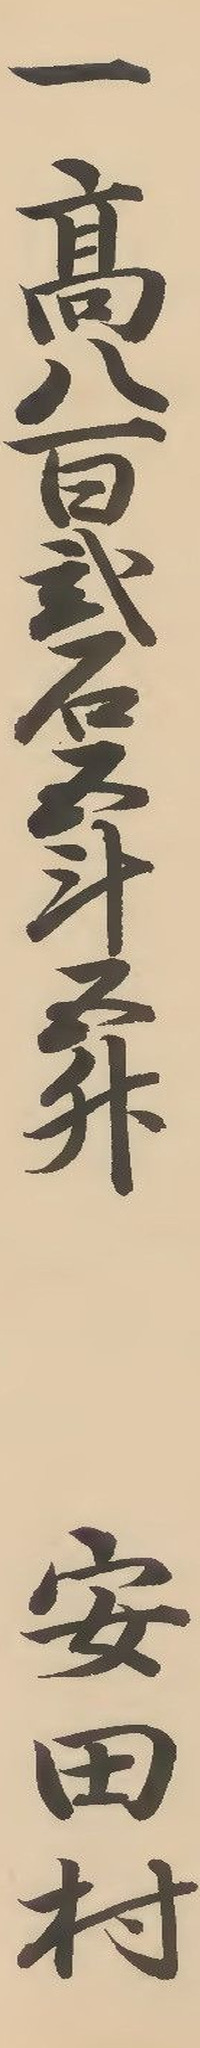一高八百弐石五斗五升安田村
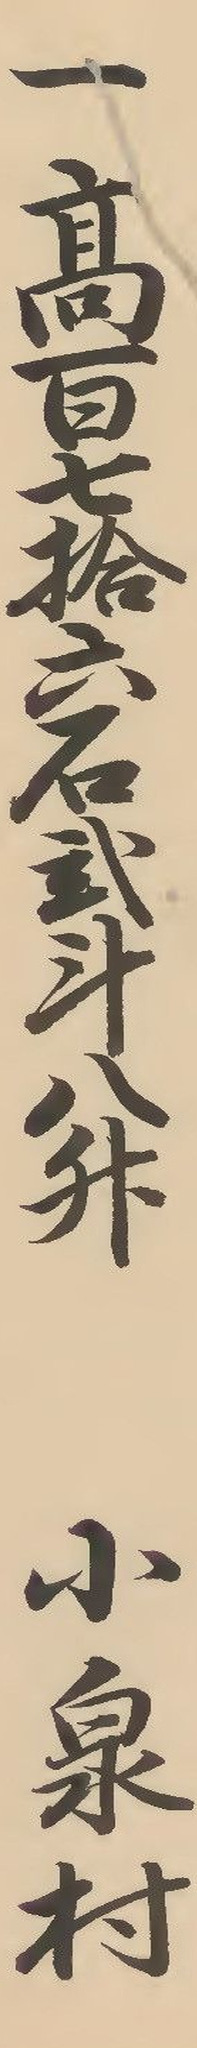一高百七拾六石弐斗八升小泉村

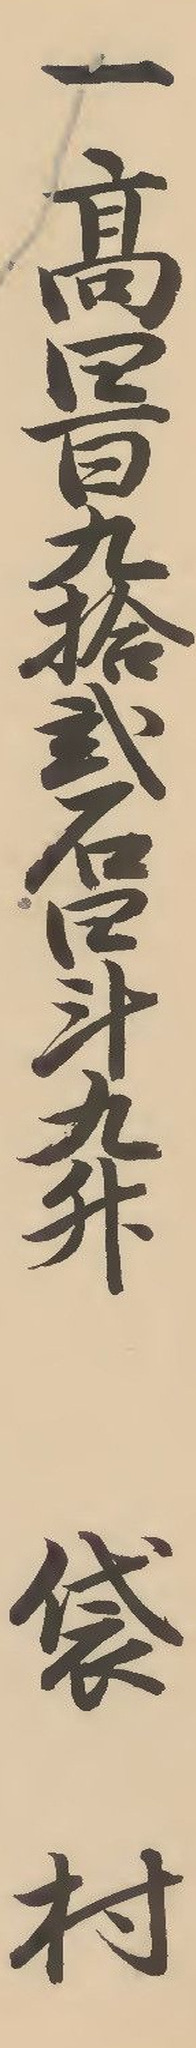一高四百九拾弐石四斗九升袋村
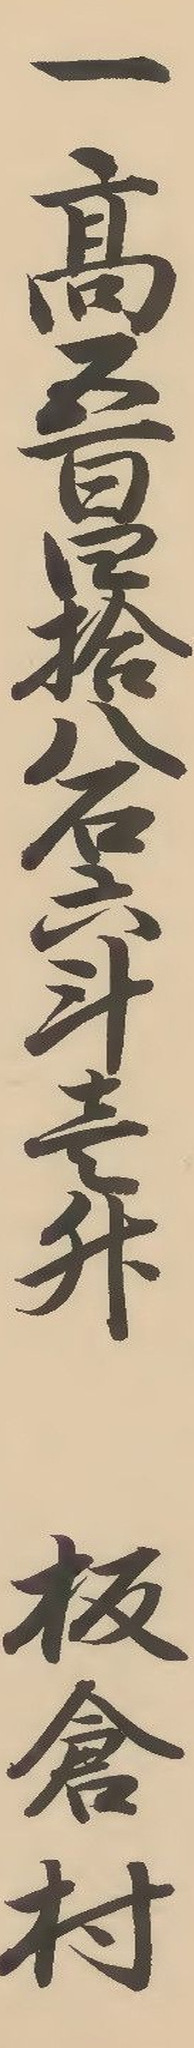一高五百四拾八石六斗壱升板倉村
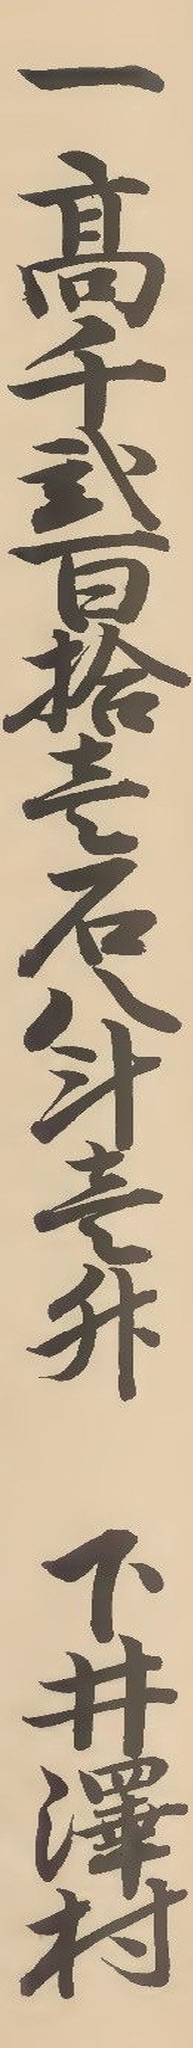一高千弐百拾壱石八斗壱升下井沢村
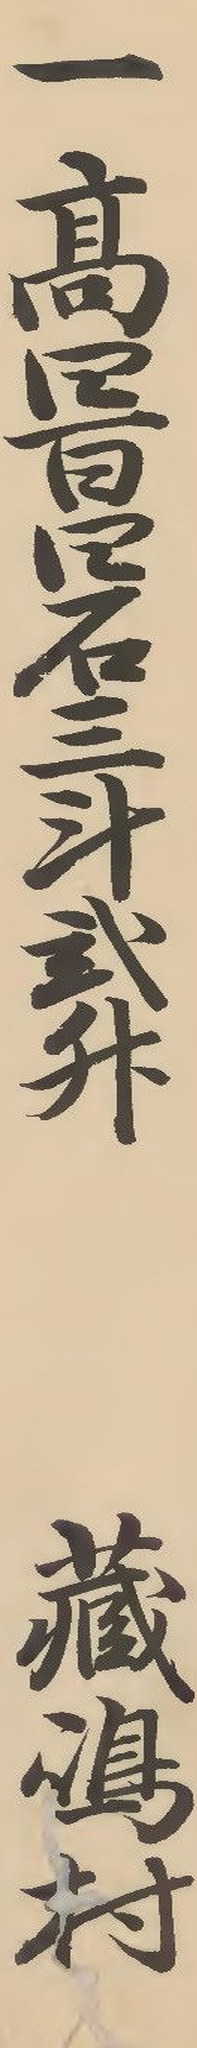一高四百四石三斗弐升蔵島村
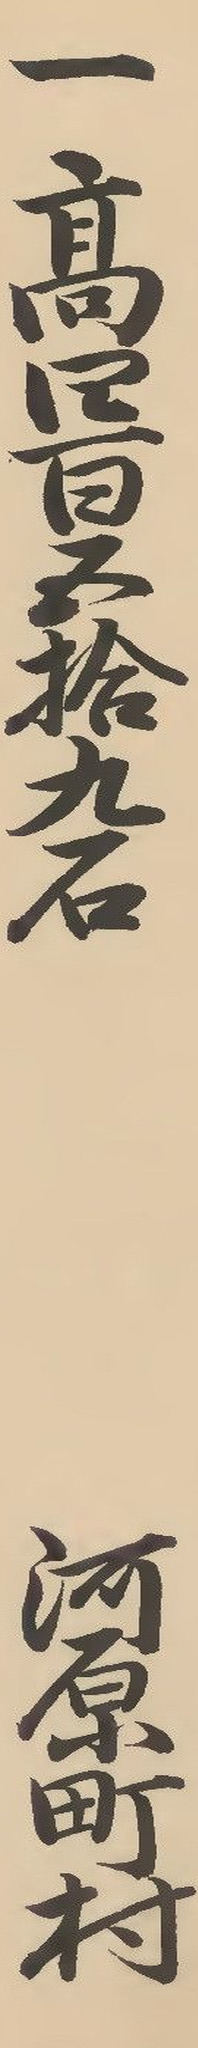一高四百五拾九石河原町村
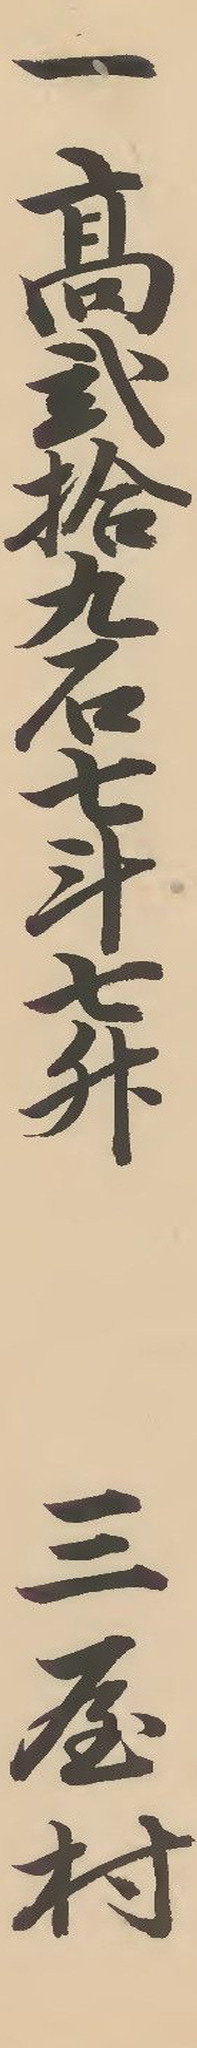一高弐拾九石七斗七升三屋村

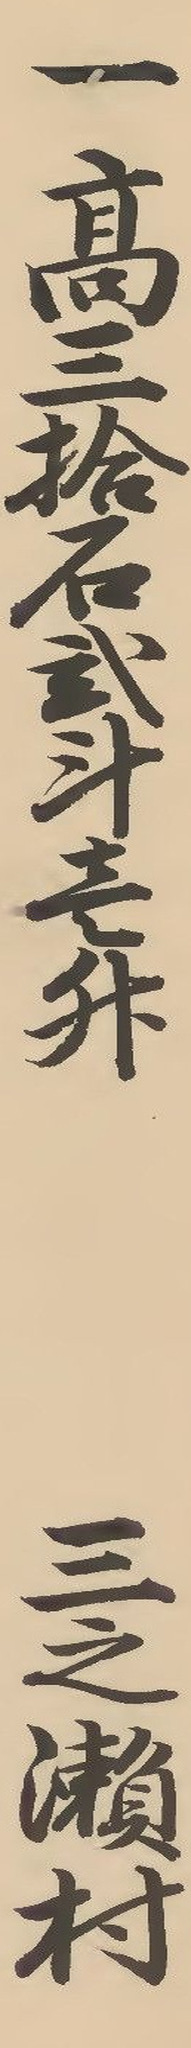一高三拾石弐斗壱升三之瀬村
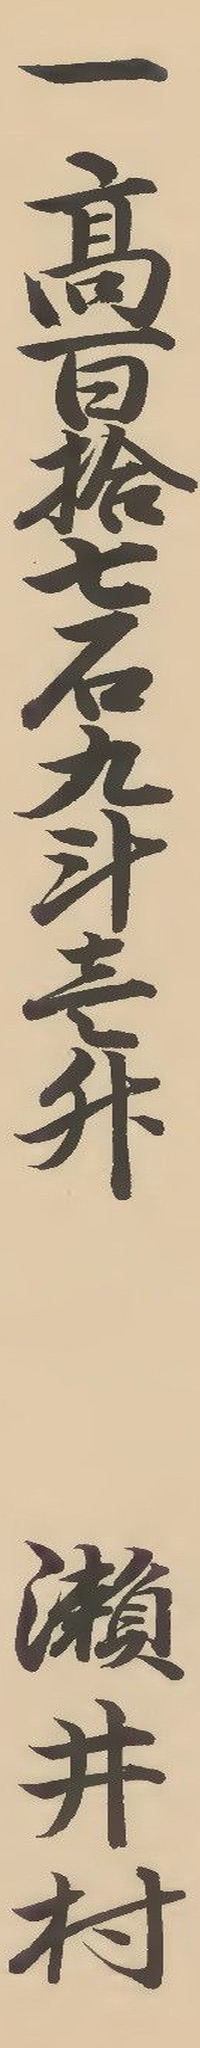一高百拾七石九斗壱升瀬井村
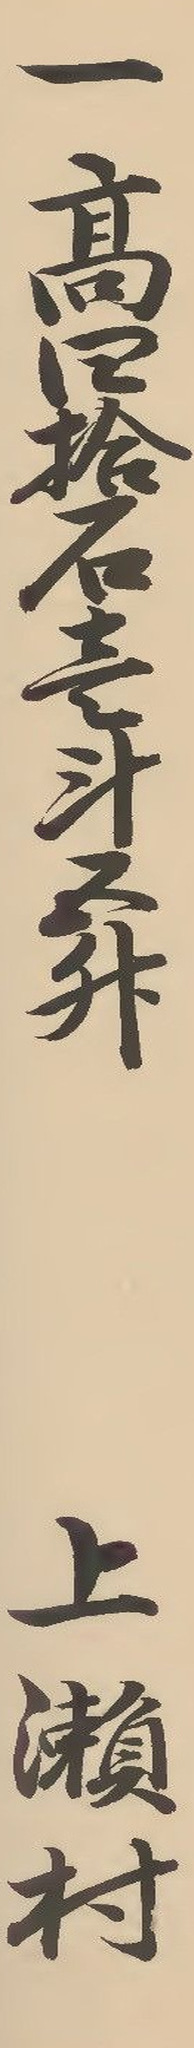一高四拾石壱斗五升上瀬村
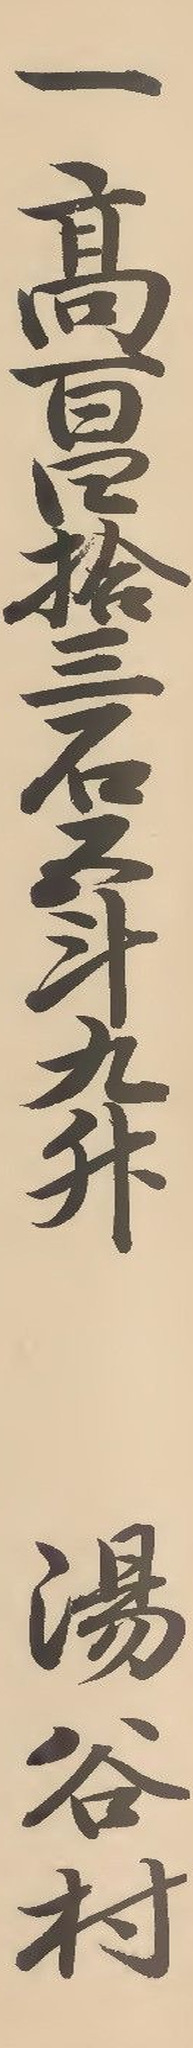一高百四拾三石五斗九升湯谷村
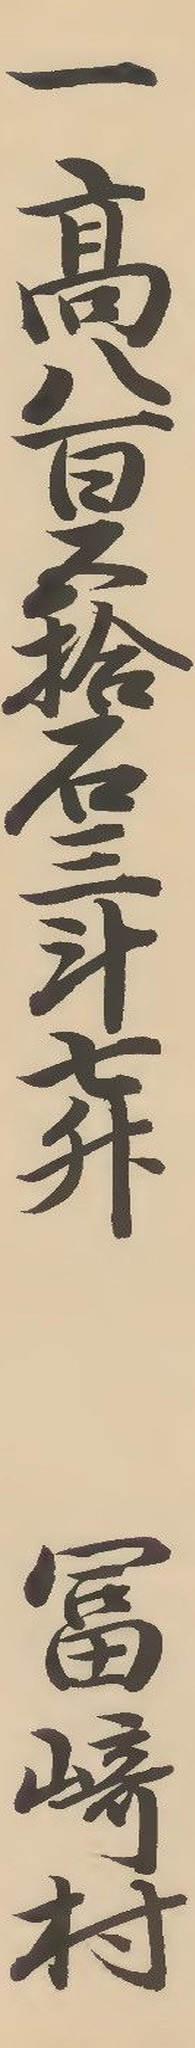一高八百五拾石三斗七升富崎村
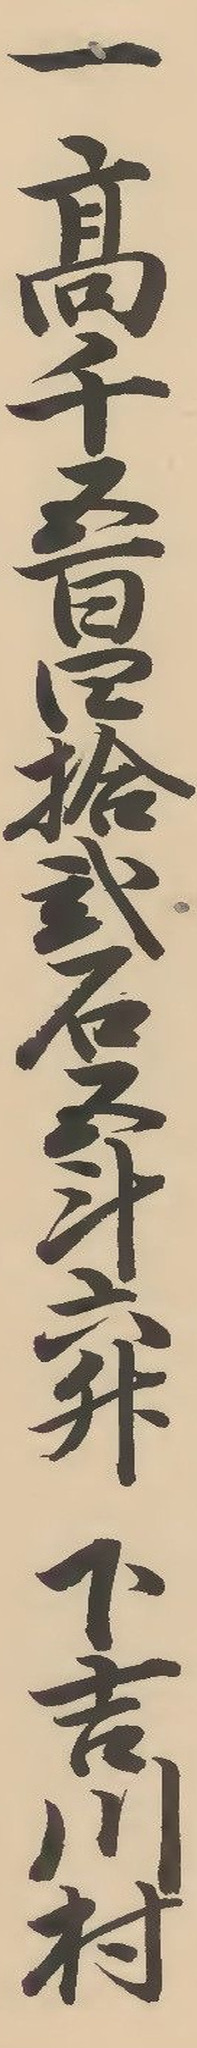一高千五百四拾弐石五斗六升下吉川村

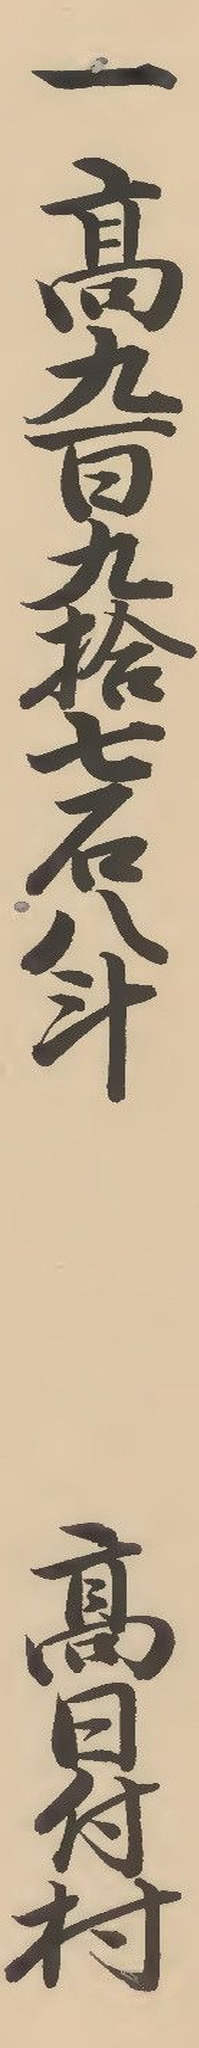一高九百九拾七石八斗高日付村
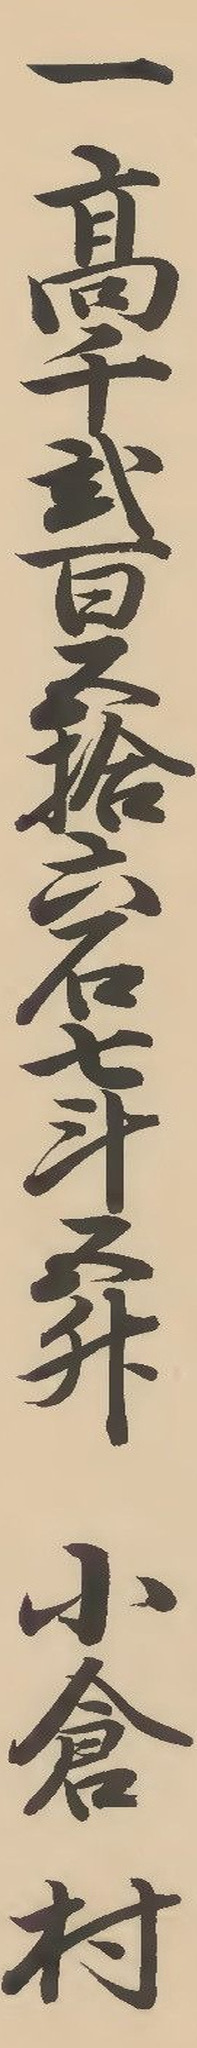一高千弐百五拾六石七斗五升小倉村
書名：越中国郷帳
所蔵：国立公文書館 National Archives of Japan
